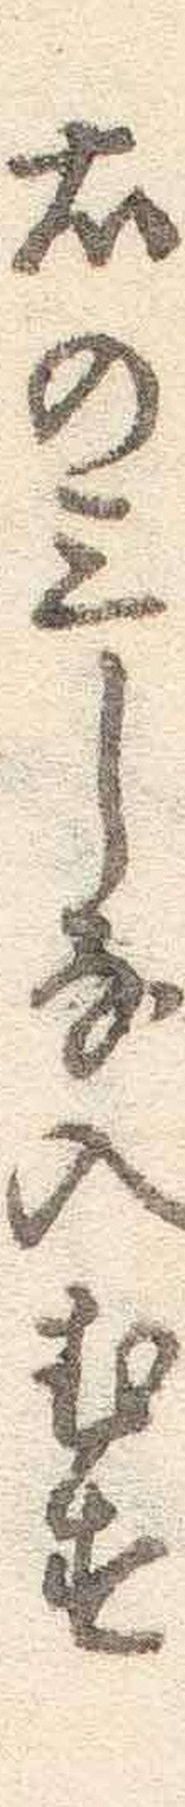右の三しな入むす
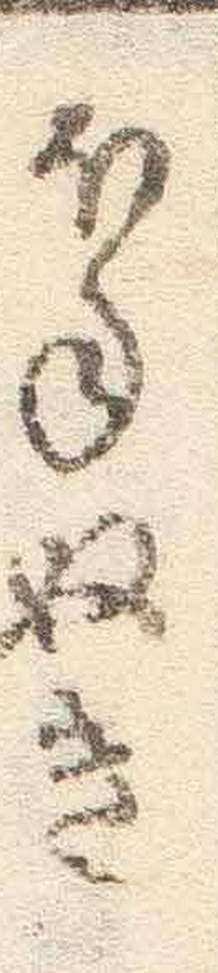ほねぬき
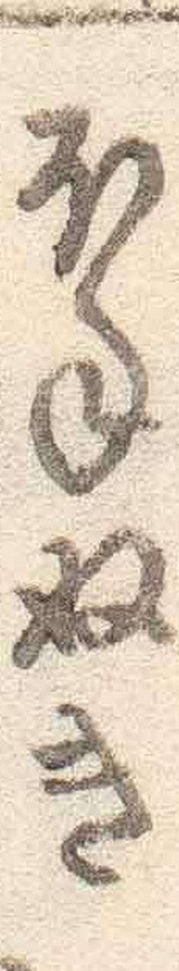ほねぬき
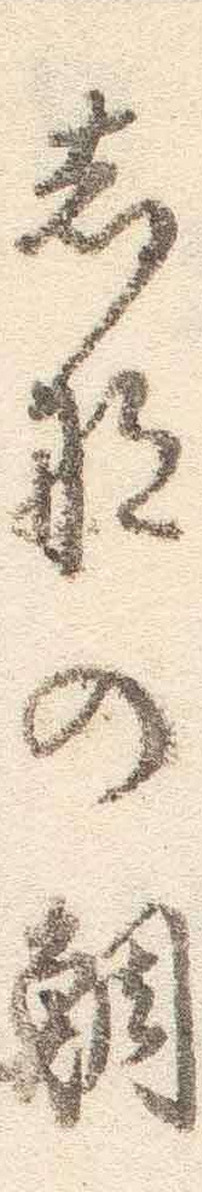しなの鯛
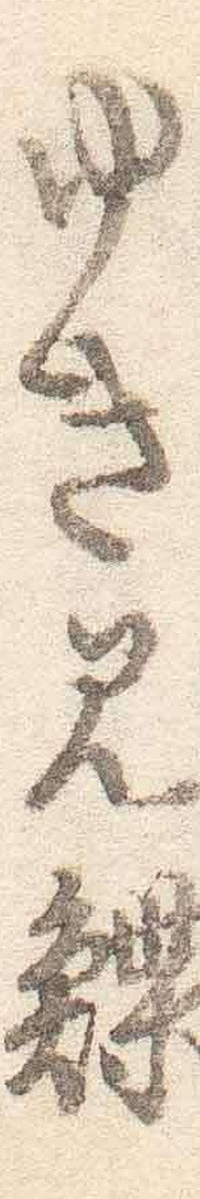ゆき見鰈
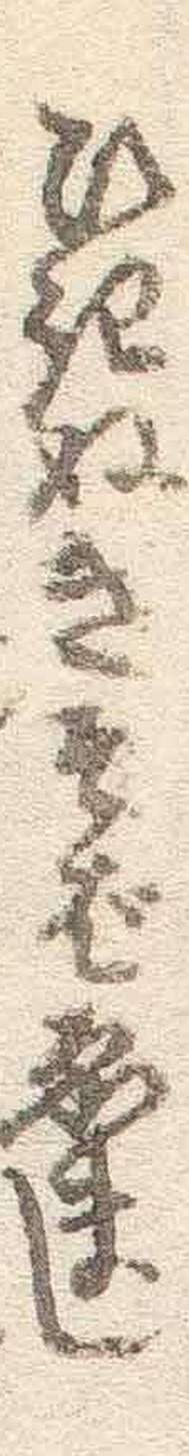ひきぬきそばゑまし
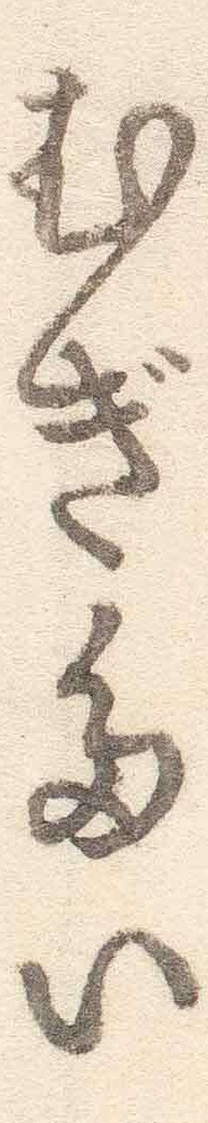むぎたい
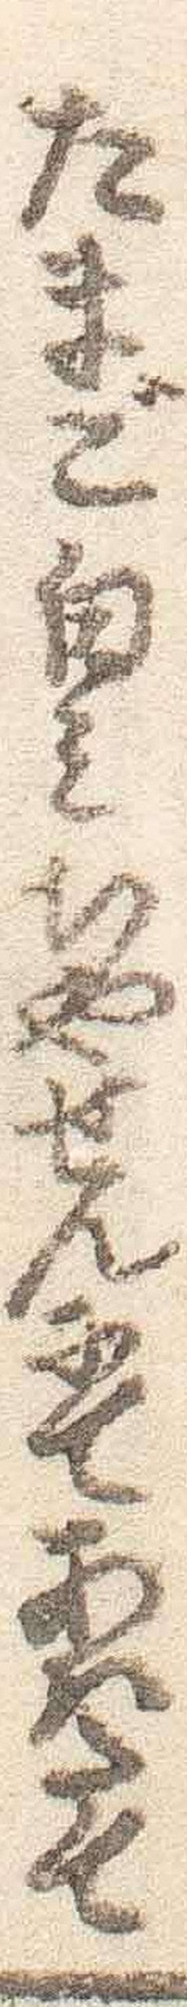たまご白みちやせんにてあはたて
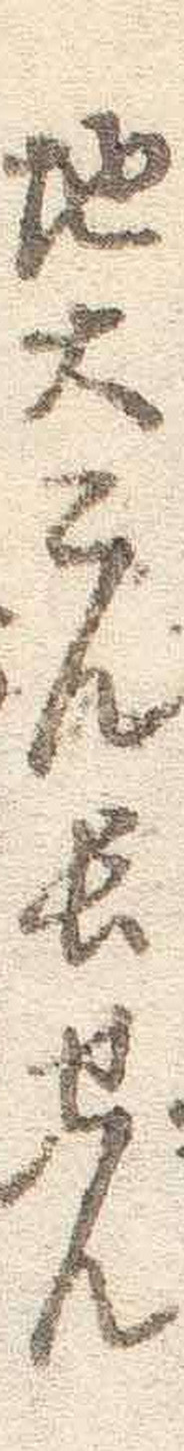地大こん長せん
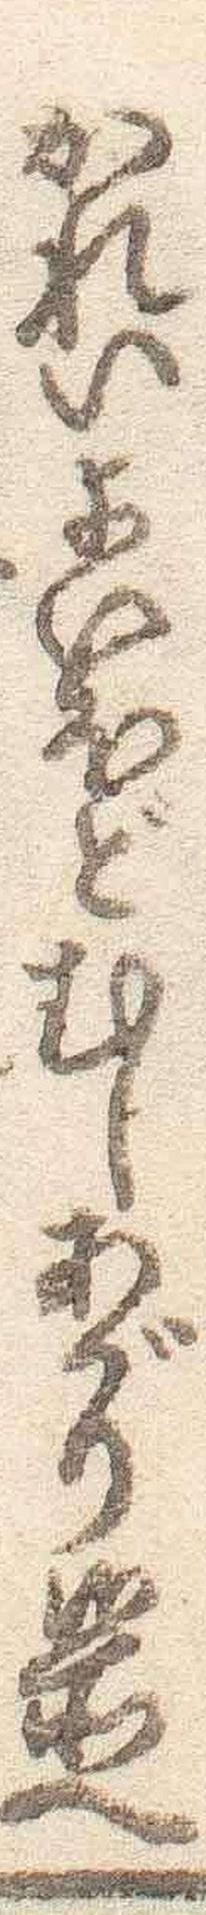かれいよいほどむしあがり候所へ
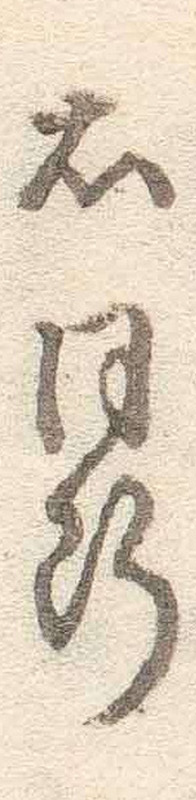右同断
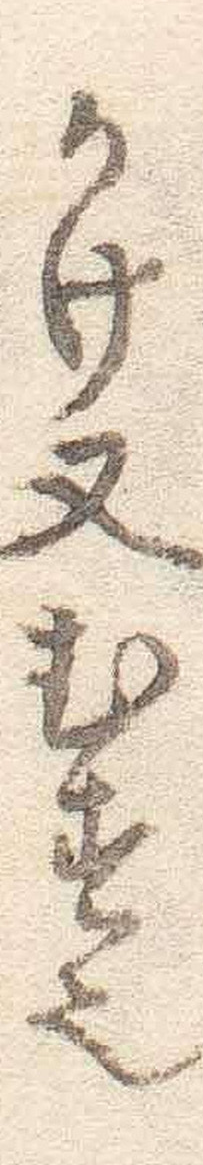かけ又むす也
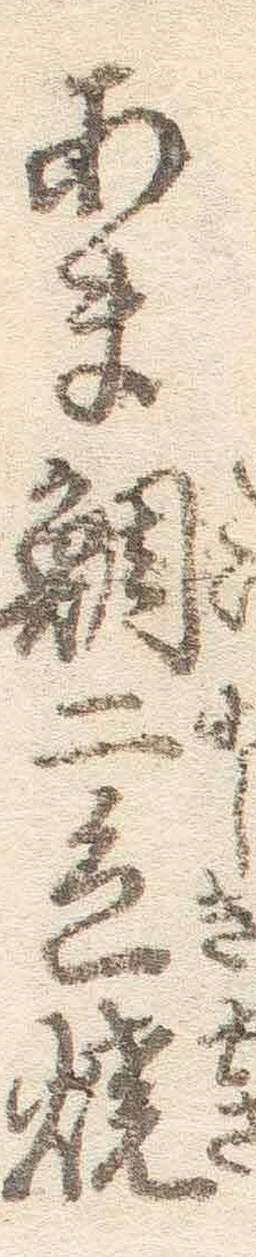あま鯛二色焼
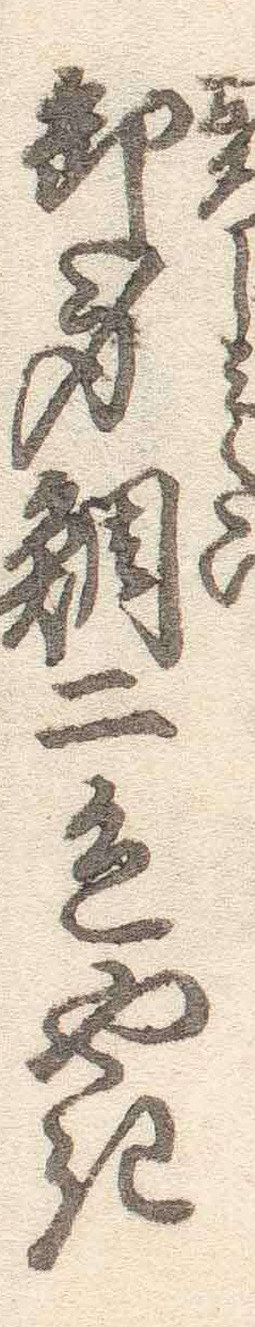卸身鯛二色やき
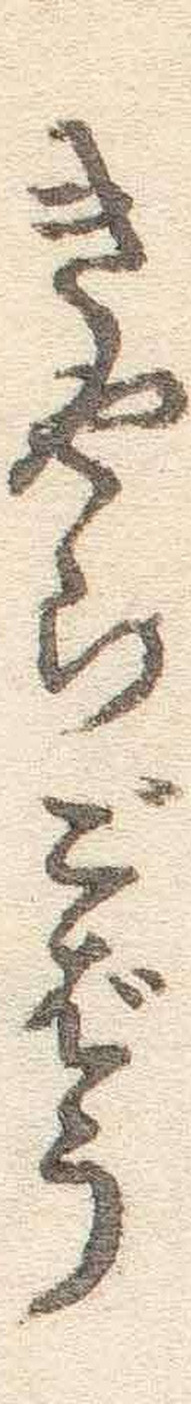きやらごばう
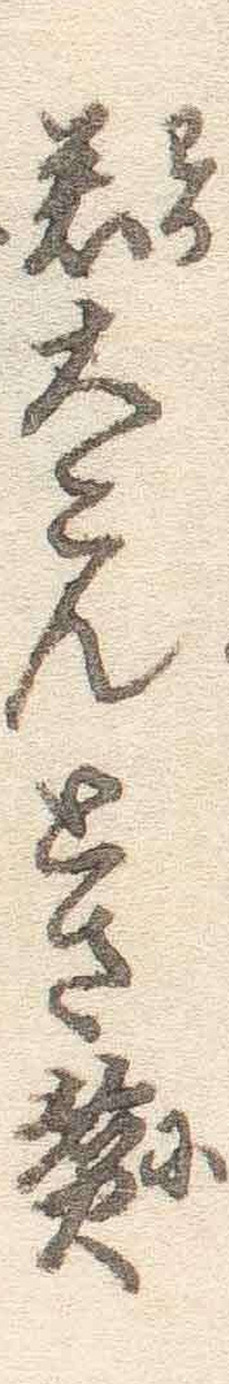若大こんとさ煮
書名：料理通
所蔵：東京学芸大学附属図書館 国文学研究資料館
